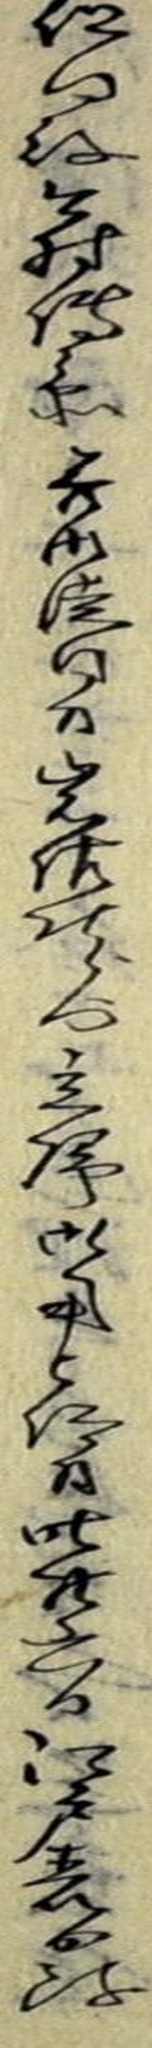但同役今村伝兵衛并御徒目付岩佐次郎右衛門立帰御用被仰付昨廿六日江戸表ゟ致
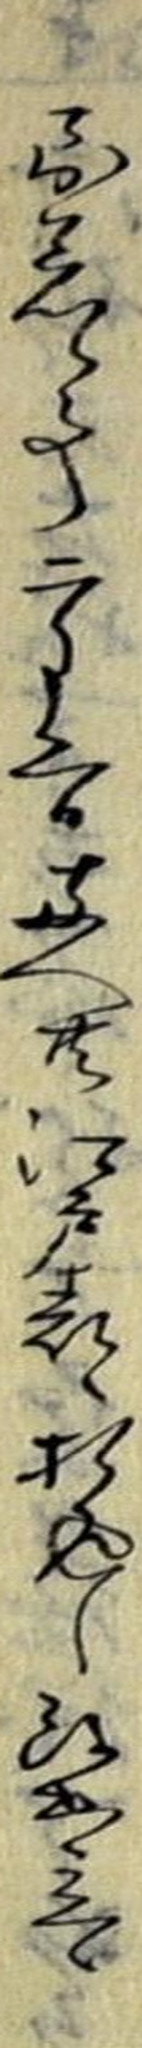到着候事二月二日両人共江戸表へ折返し致出立候
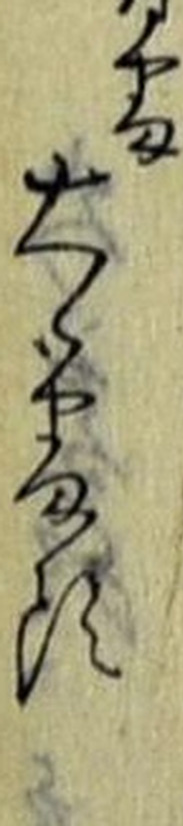大御番頭
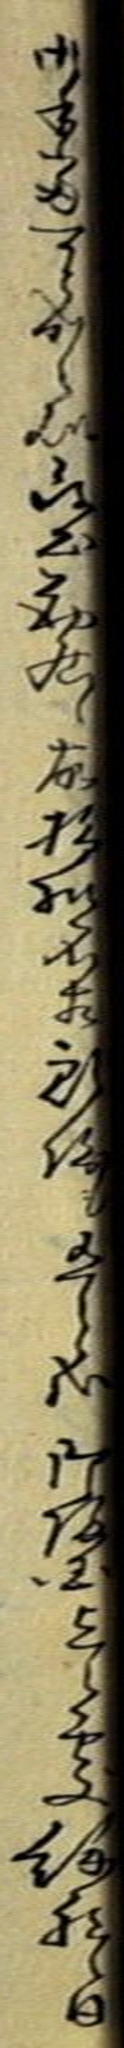御手当可被成候処即出勤居候故指掛不相願儀も有之哉御帰国迄之処餘程之日
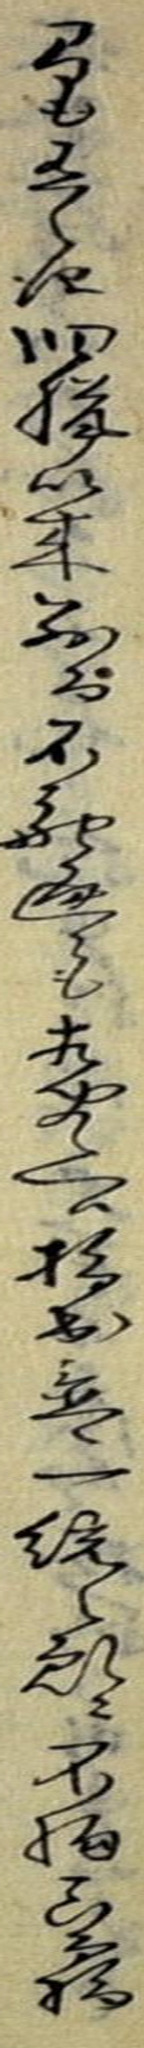間も有之儀旧蝋以来別而不融通にも相聞候へは指出置候一統之願に不拘至而指
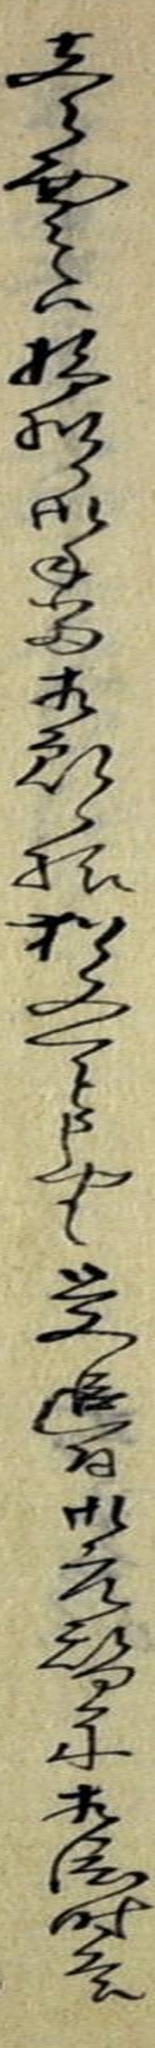支之面々には指掛り御手当相願候様猶又可被申聞候且又追付御取替米相渡時節
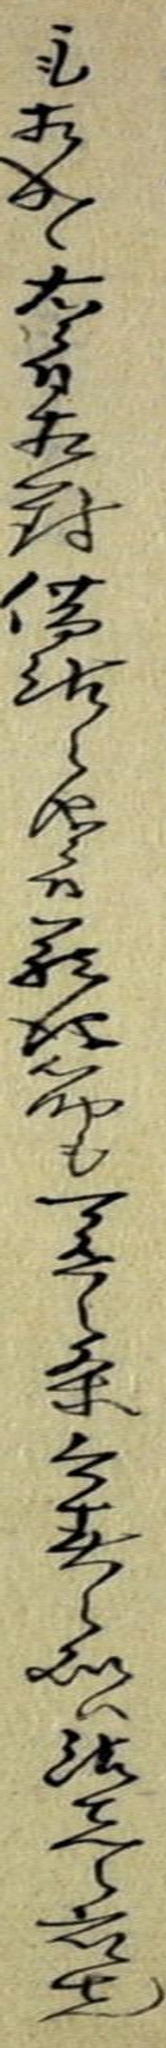にも相成候右に付相対借銀之儀に付難儀筋も可有之候条今春之処は銀元之者銀先
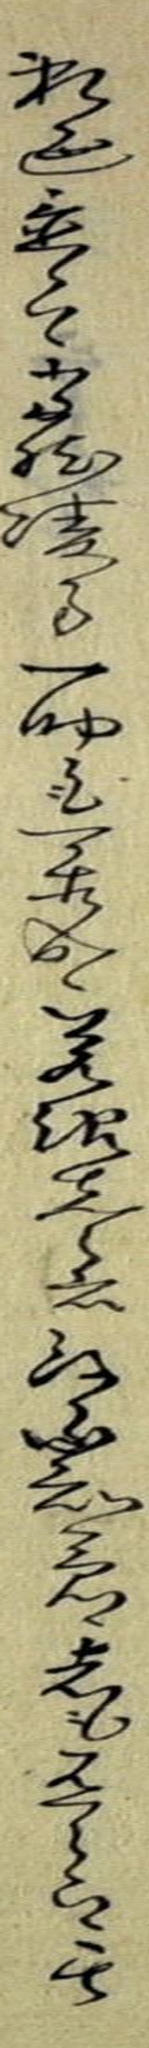頼延置候はヽ当然凌方一助にも可相成候若銀先之者致承知兼候者も有之候ハゝ其
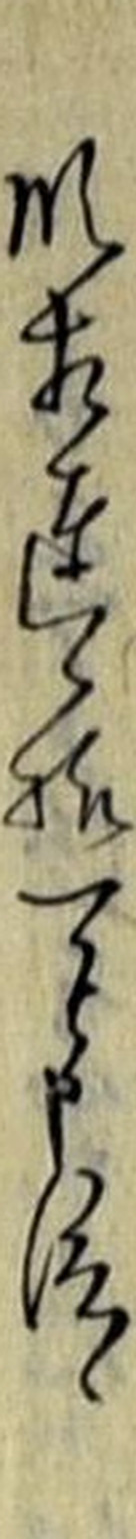段相達候様可被申渡候
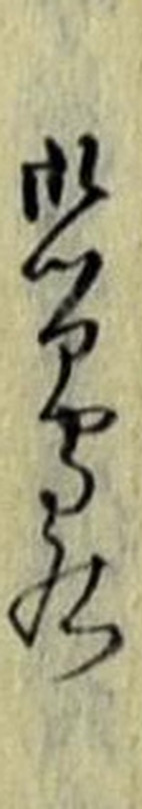御留守居
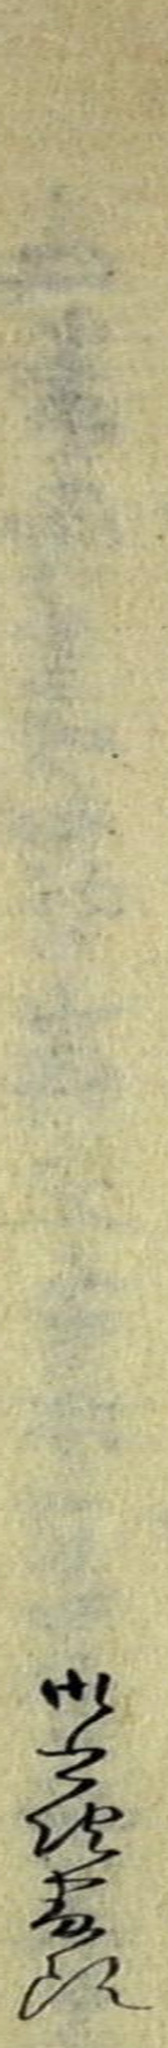御書院番頭
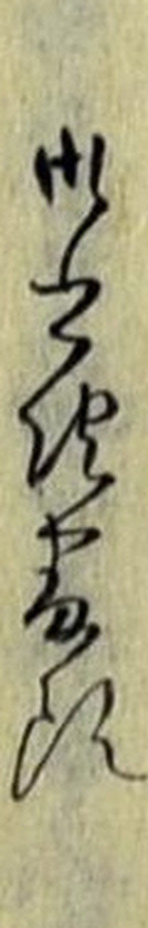御書院番頭
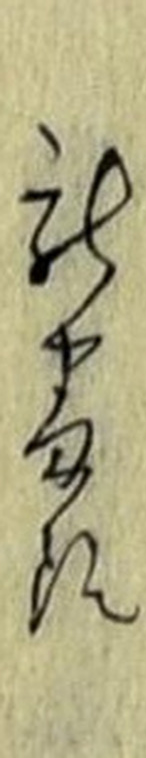新番頭
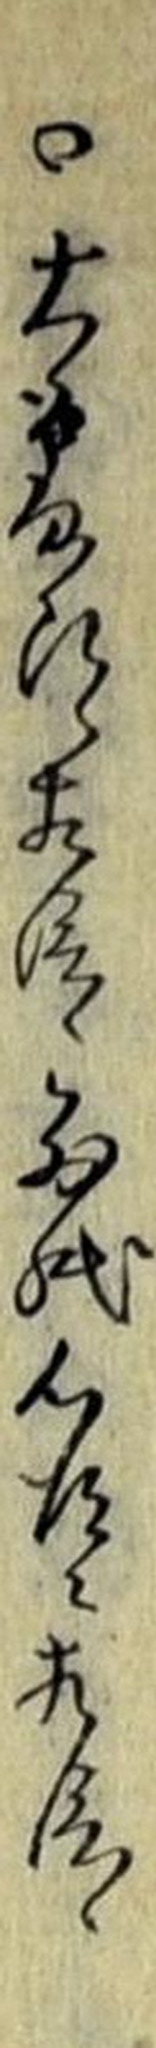○大御番頭へ相渡候別紙心得に相渡候
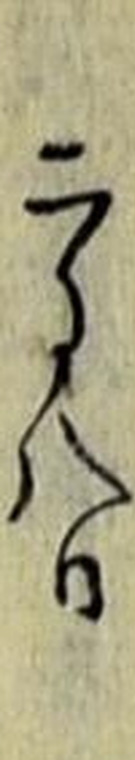二月八日
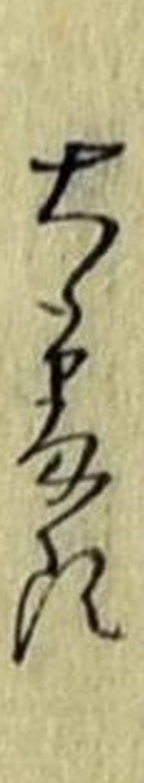大御番頭
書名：命令之部 四
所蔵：福井県文書館 Fukui Prefectural Archives
